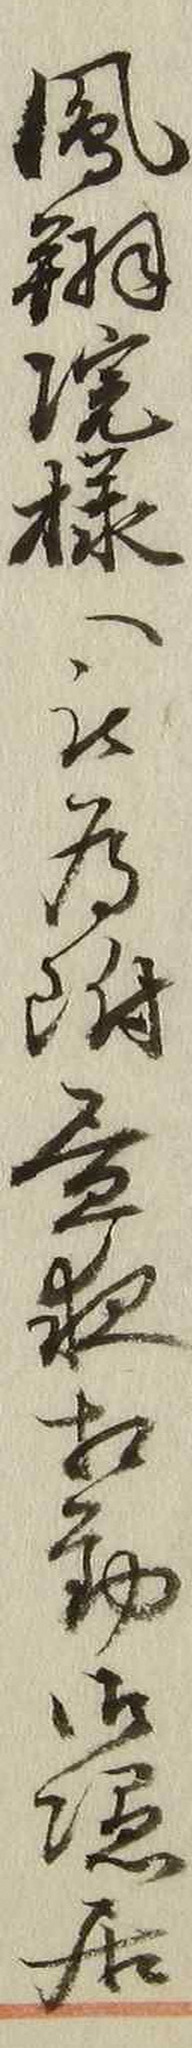鳳翔院様へ被為附昼夜相勤御隠居
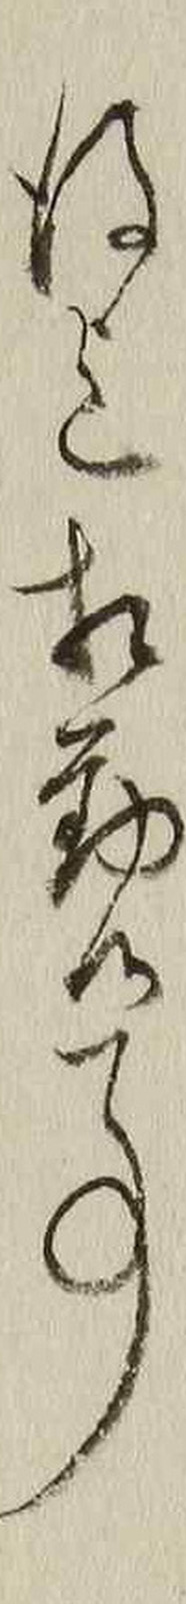後迄相勤候事
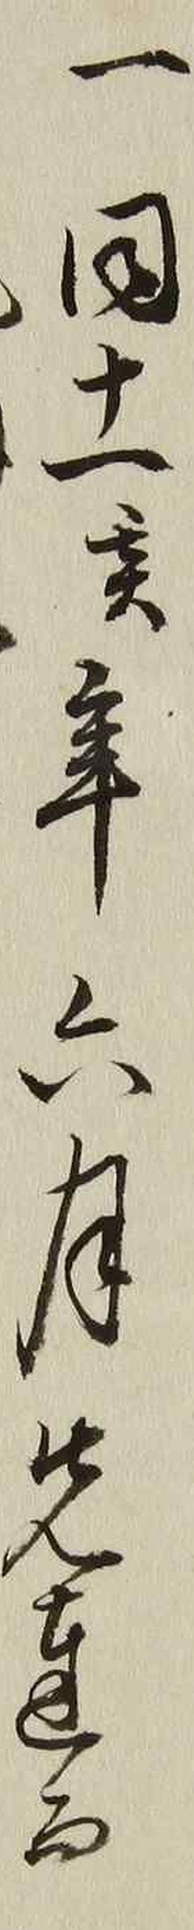一同十一亥年六月先達而
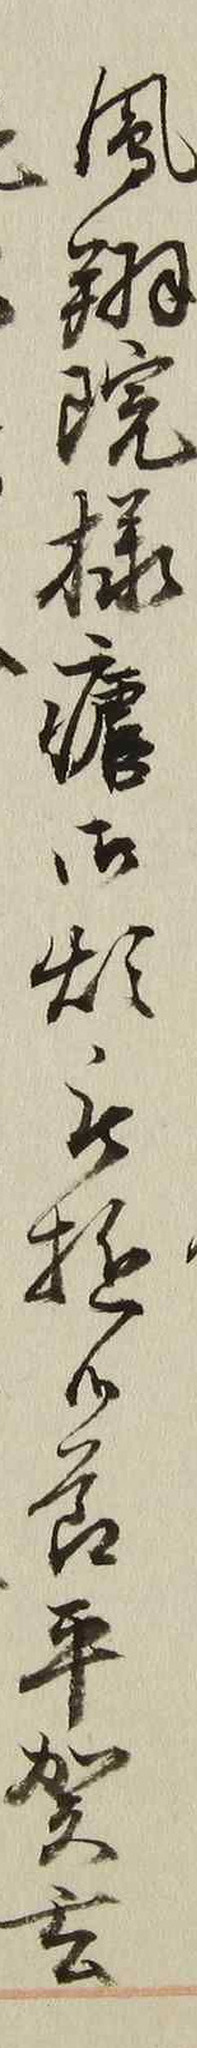鳳翔院様瘧御煩被遊候節平賀玄
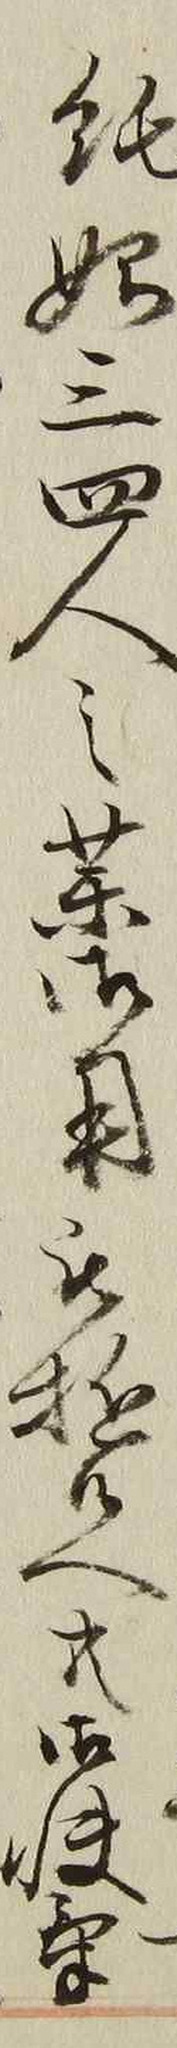純始三四人之薬御用被遊候へ共御快気
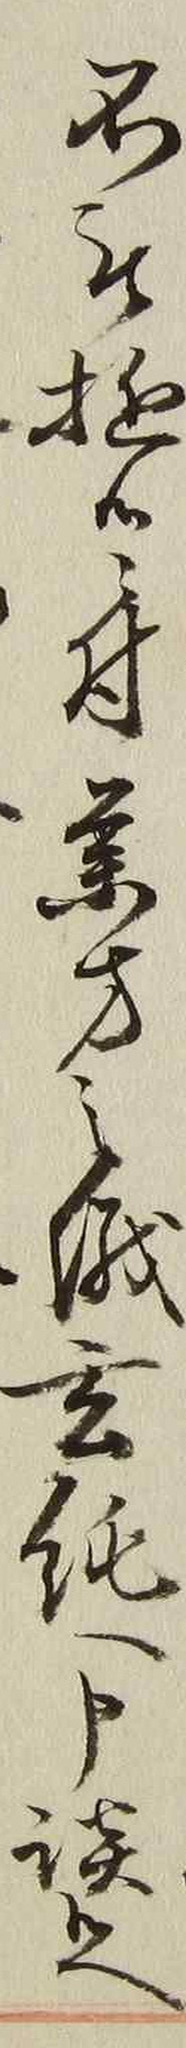不被遊候ニ付薬方之儀玄純へ申談候へ
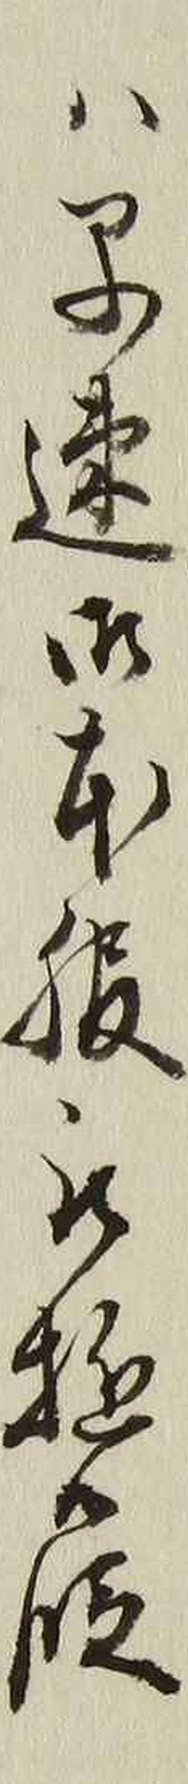ハ早速御本服被遊候段
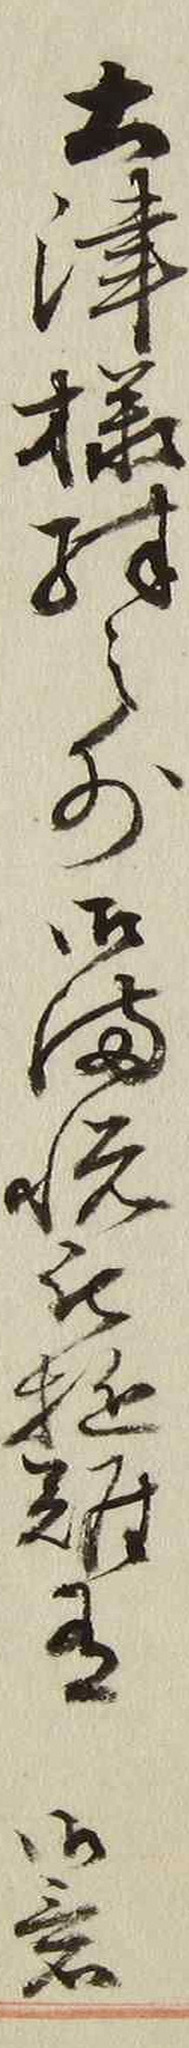土津様殊之外御満悦被遊難有御意
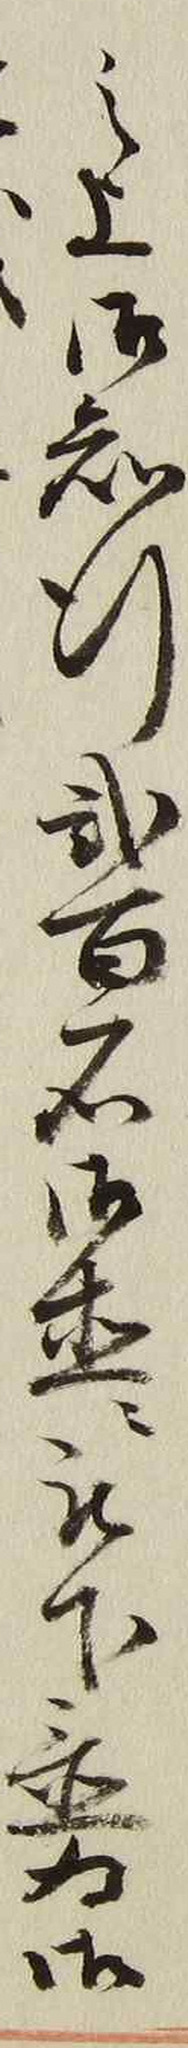之上御知行弐百石御直ニ被下置為御
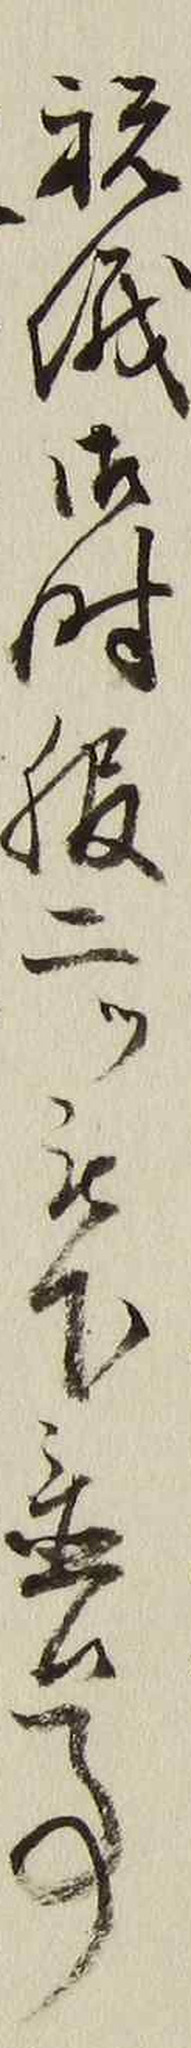祝儀御時服二ツ被下置候事
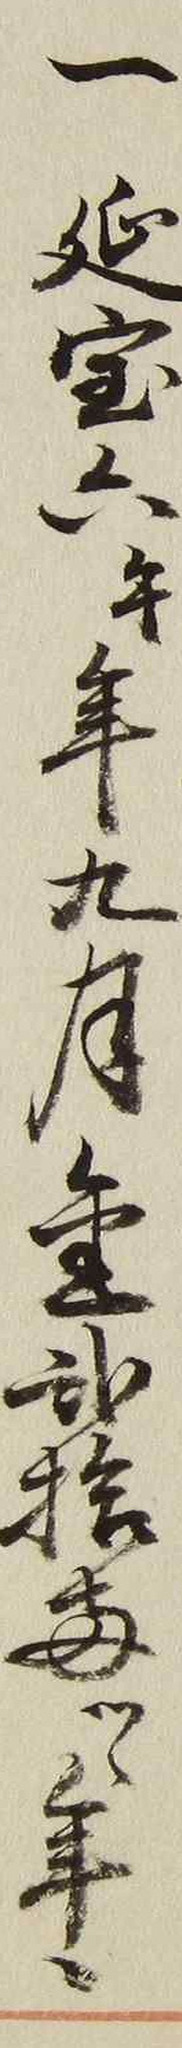一延宝六午年九月金弐拾両ツヽ年々
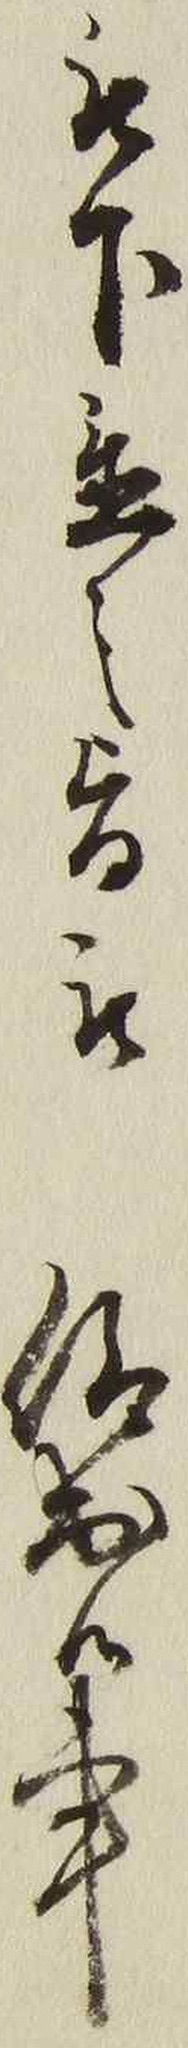被下置之旨被仰出候事

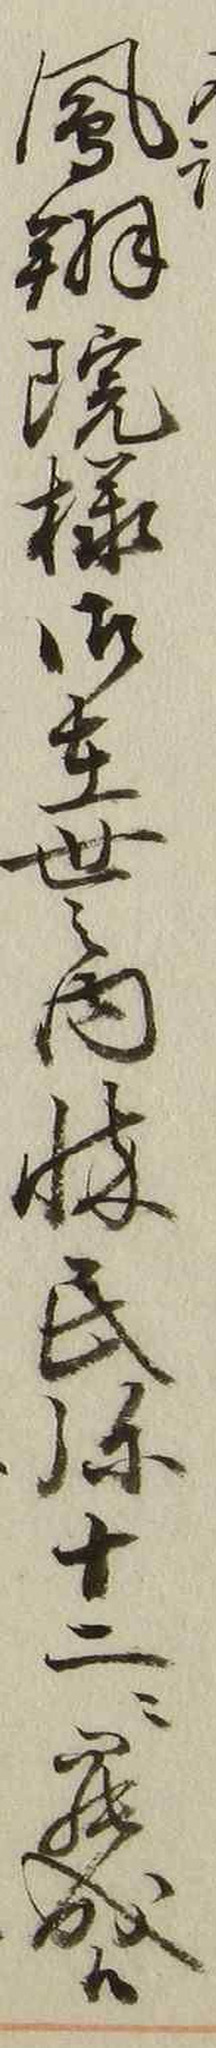鳳翔院様御在世之内忰民弥十二ニ罷成候
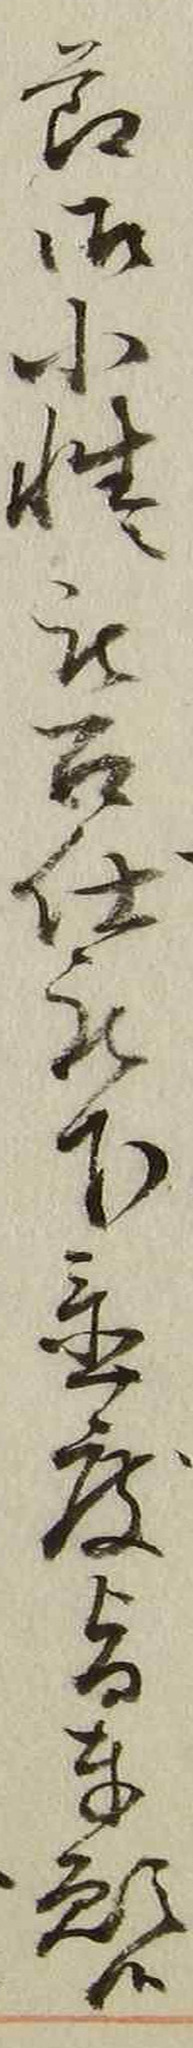節御小性ニ被召仕被下置度旨奉願候
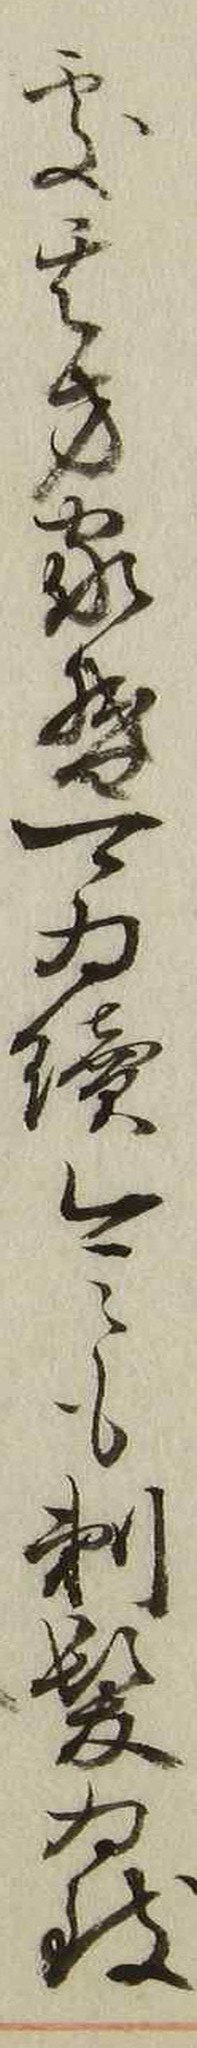処其方家督可為続今ニも剃髪為致
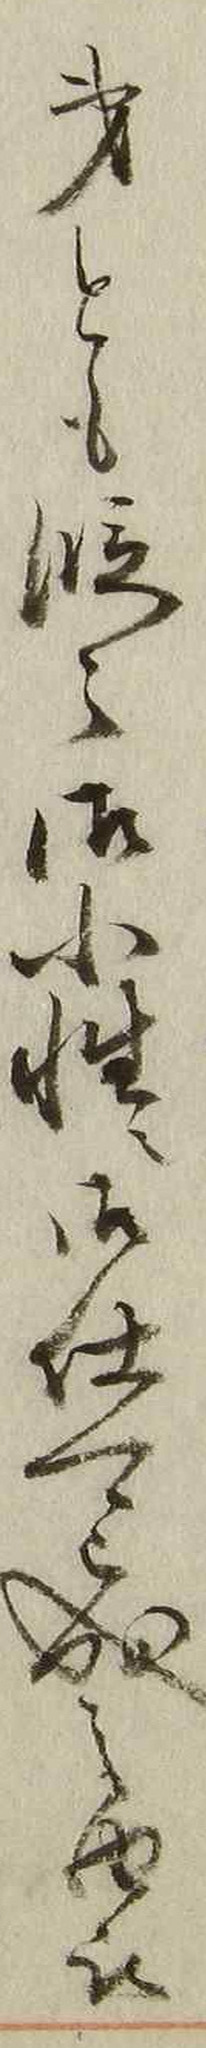弟とも段々御小性ニ御仕可被成之由被
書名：諸士系譜　巻之39　は之部7
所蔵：会津若松市立会津図書館
